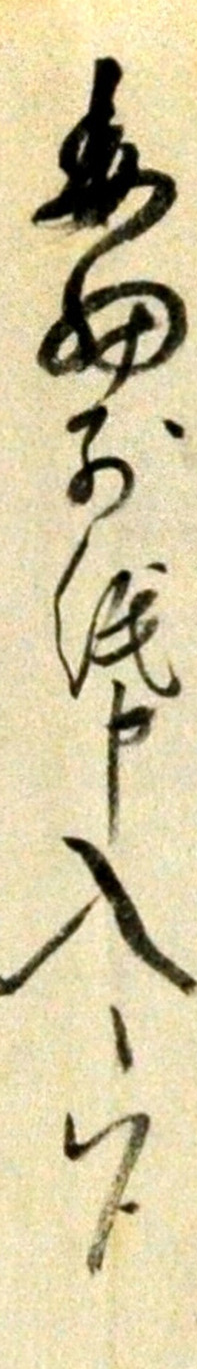委細別紙申入候以上
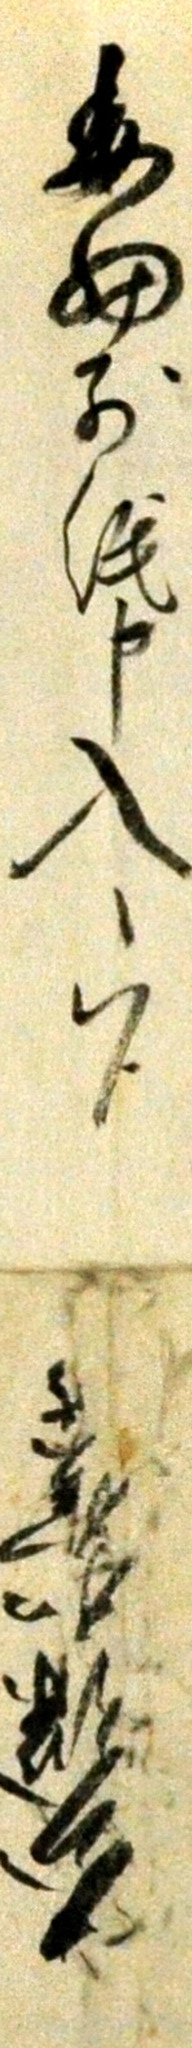委細別紙申入候以上
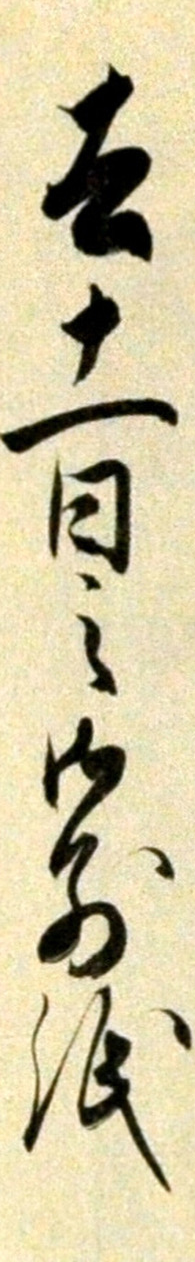去十一日之御別紙
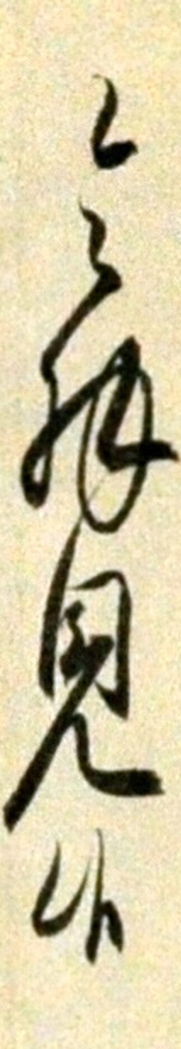令拝見候
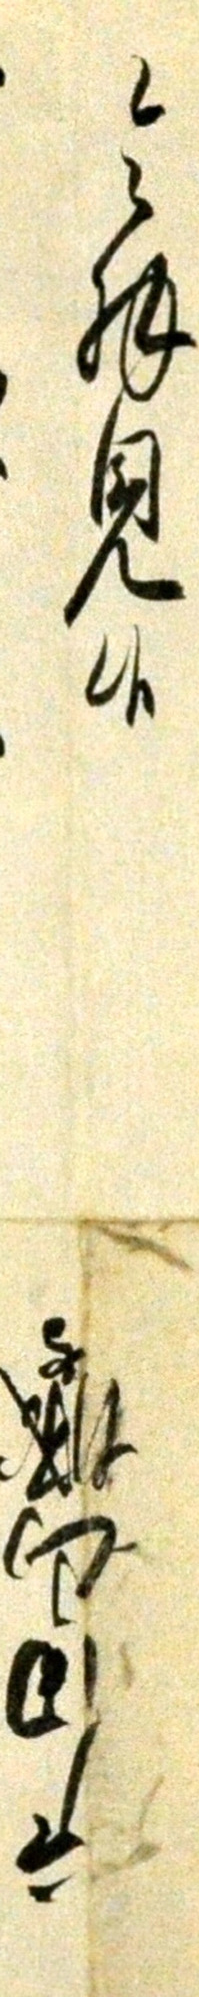令拝見候
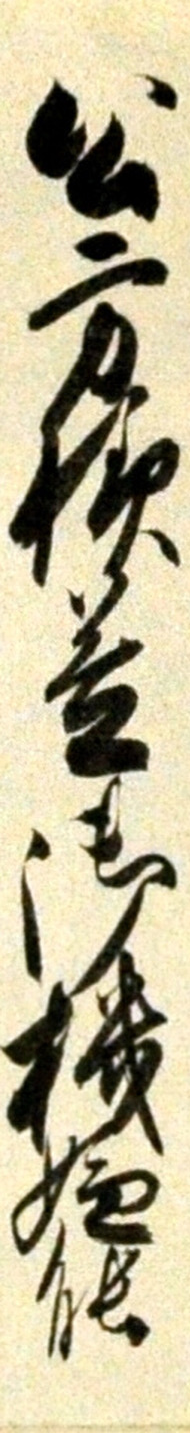公方様益御機嫌能
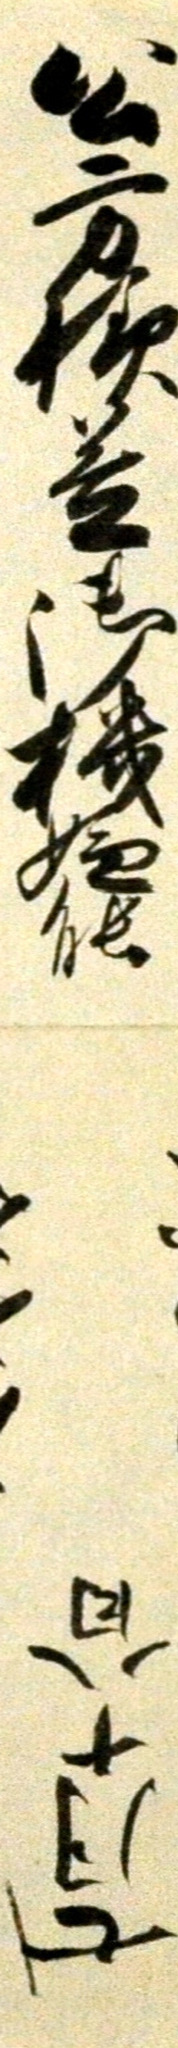公方様益御機嫌能
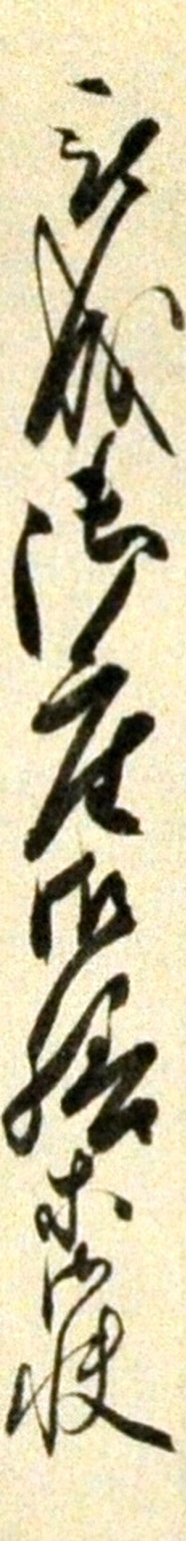被成御座御膳等御快
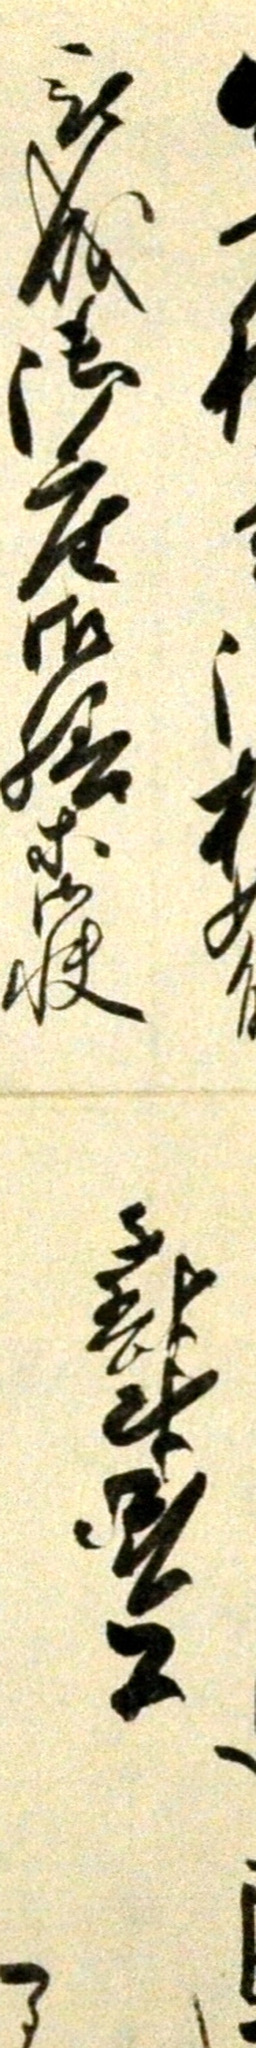被成御座御膳等御快
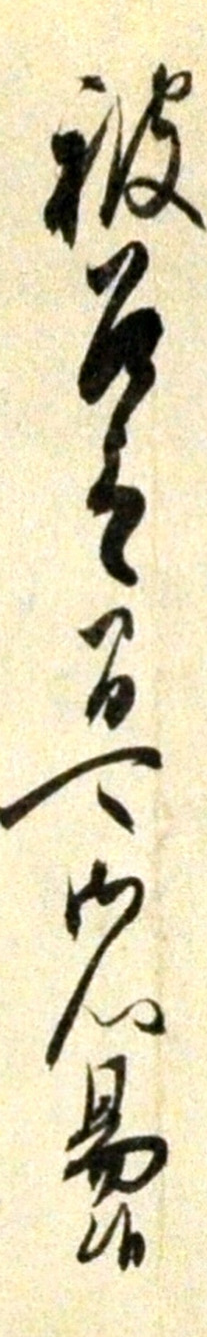被召上候間可御心易候
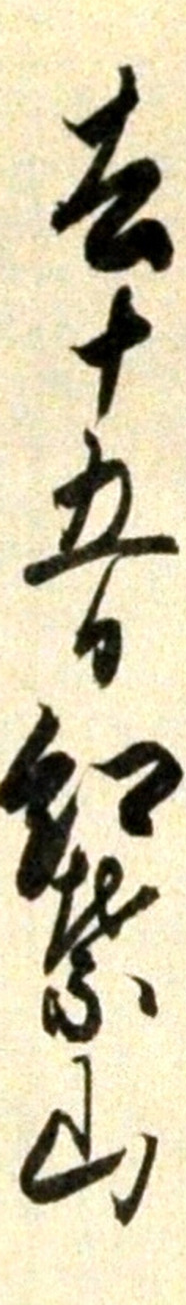去十五日紅葉山
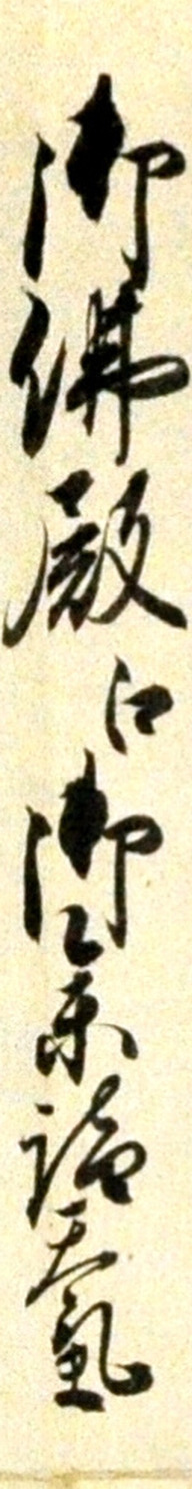御仏殿江御参詣天気
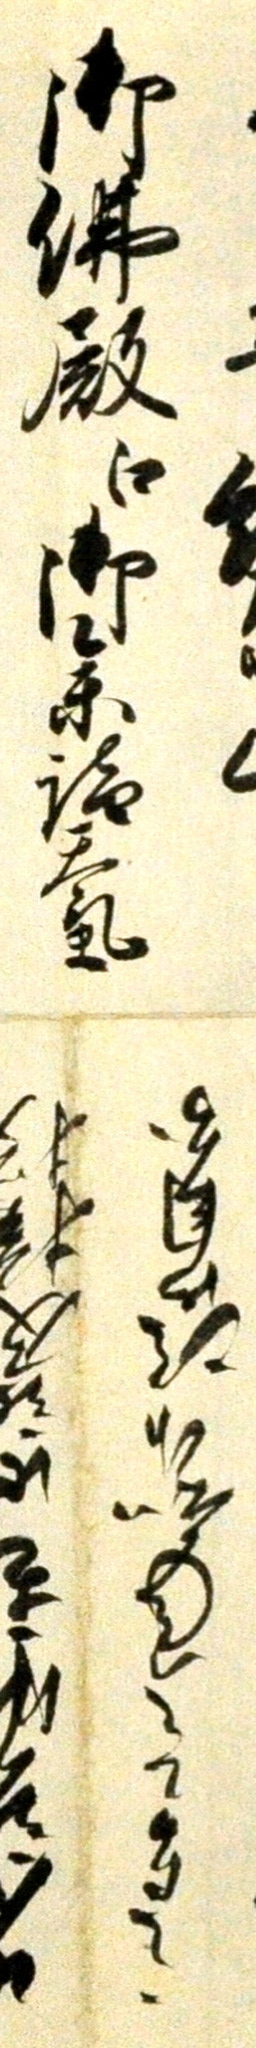御仏殿江御参詣天気
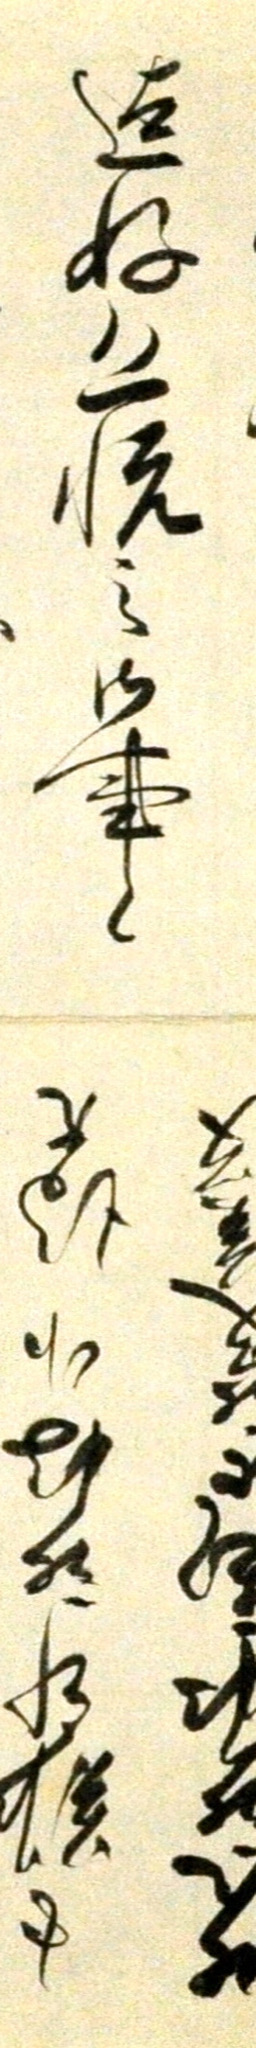迄好恐悦之御事候
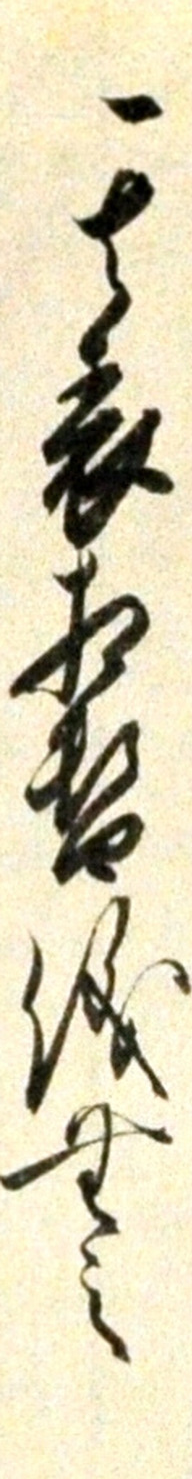其表相替儀無之
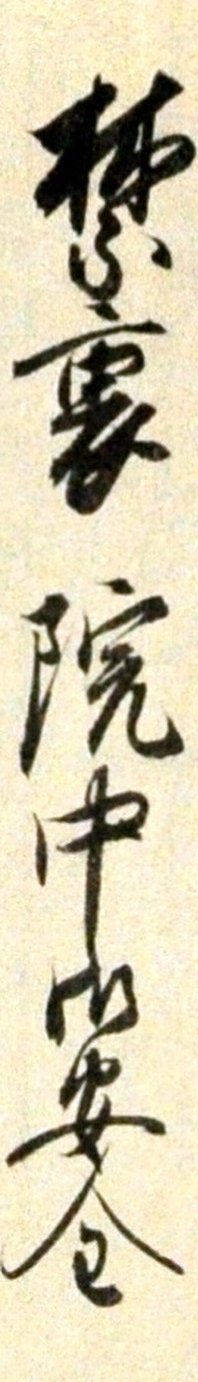禁裏院中御安全
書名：書状
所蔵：伊那市立高遠町図書館・合同会社AMANE
